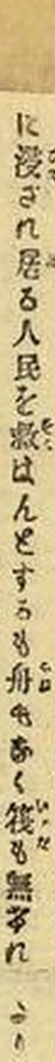に浸され居る人民を救はんとするも舟もなく筏も無けれ
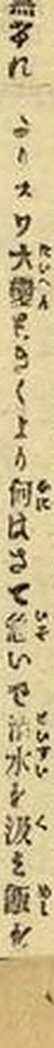たりスワ大變ときくより何はさて急いで清水を汲み飯を
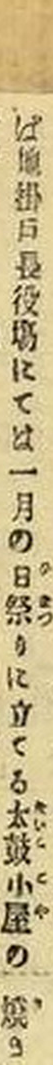ば地掛戸長役塲にては一月の日祭りに立てる太鼓小屋の
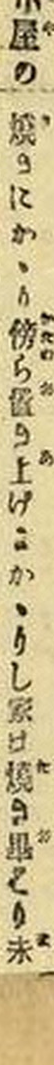燒きにかゝり傍ら置き上げにかゝりし家は燒き畢はり未
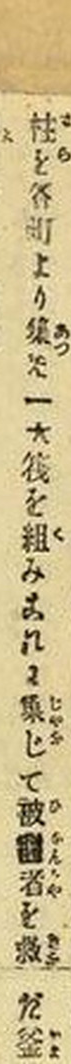柱を各町より集め一大筏を組みこれに乗じて被難者を救
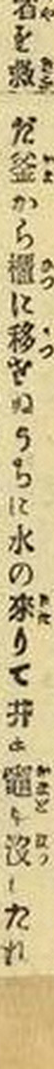だ釜から櫃に移さぬうちに水の來りて井に竈を沒したれ
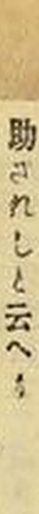助されしと云へり
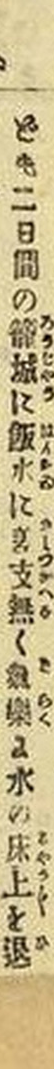ども二日間の籠城に飯水に差支無く気樂に水の床上を退
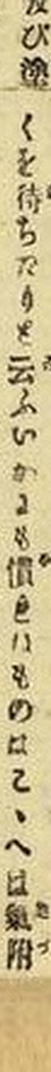くを待ちたりと云ふいかにも慣れぬものはこゝへは氣附
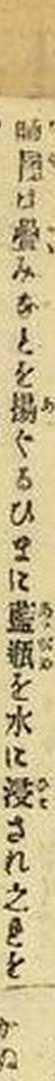師屋は疂みなとを揚ぐるひまに藍瓶を水に浸され之れを
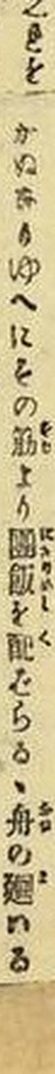かぬなりゆへにその筋より團飯を配ばらるゝ舟の廻はる
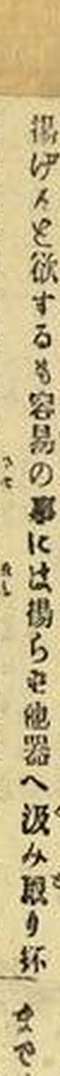揚げんと欲するも容易の事には揚らす他器へ汲み取り抔
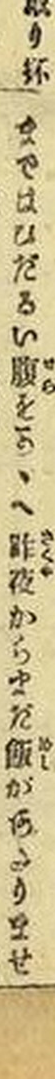まではひだるい腹をかゝへ昨夜からまだ飯があたりませ
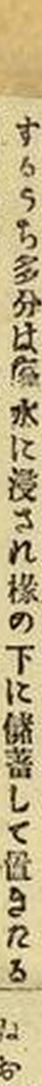するうち多分は溢水に浸され椽の下に備蓄して置きたる
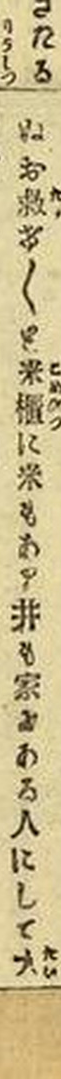ぬお救け〳〵と米櫃に米もあり井も家にある人にして大
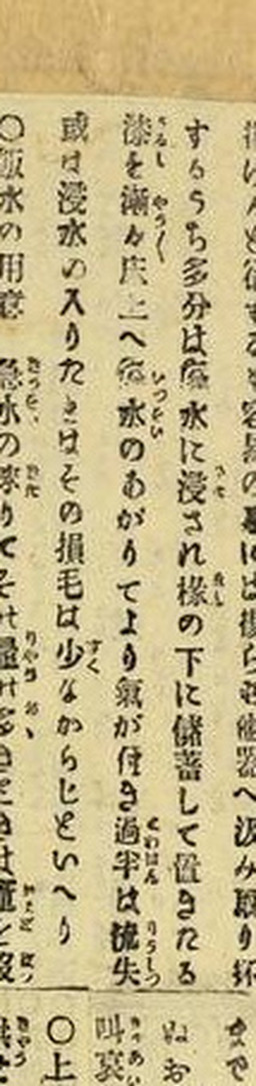漆を漸々床上へ溢水のあがりてより氣が付き過半は流失
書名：温古集 五巻
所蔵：福井県文書館 Fukui Prefectural Archives
